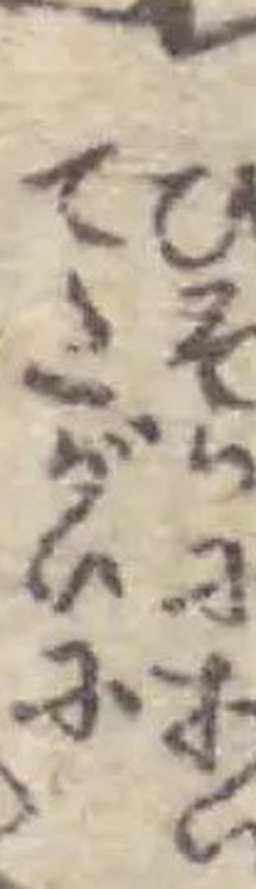てたがいに
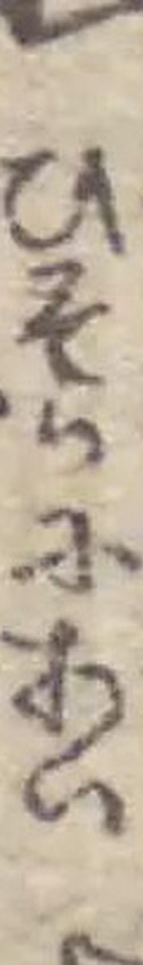ひそかにあい
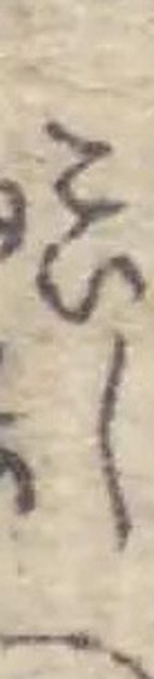こいし
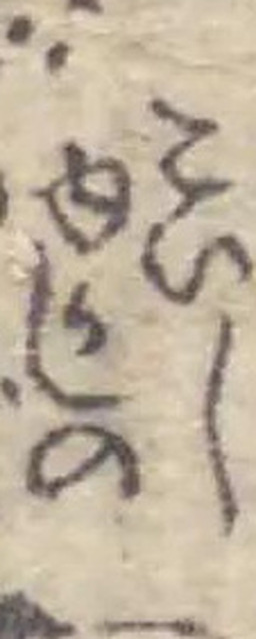ゆかしの
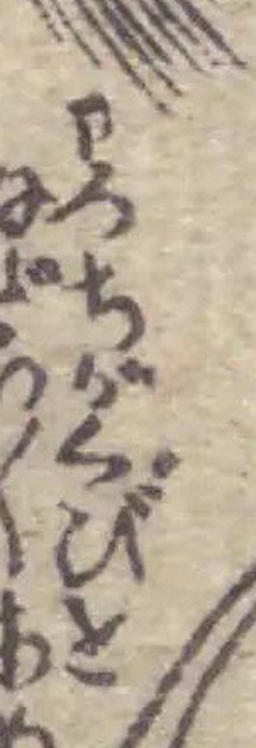わつちがくびを
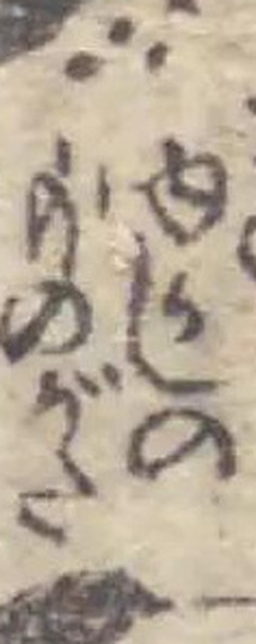ものがた
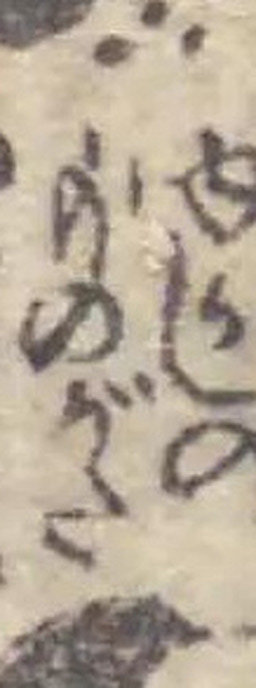ものがた
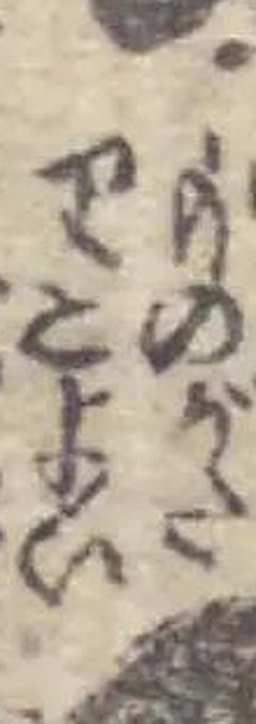りこよい
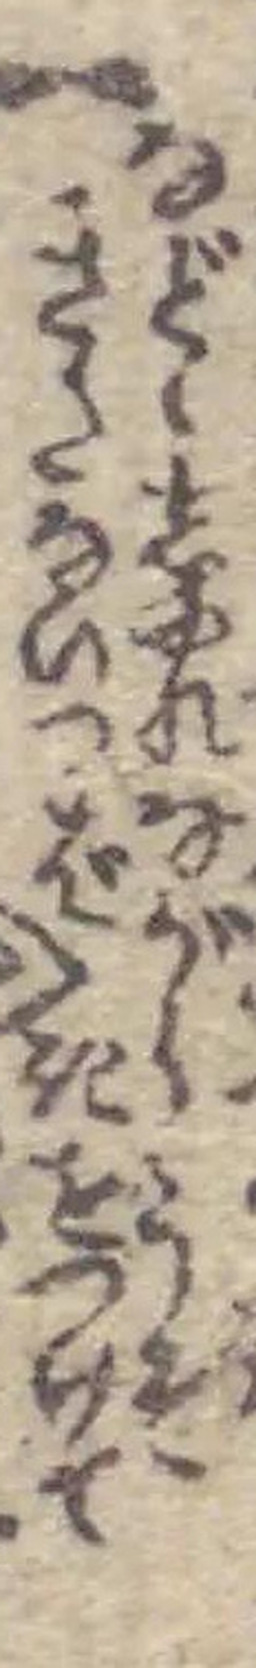きたないつばきをつけて
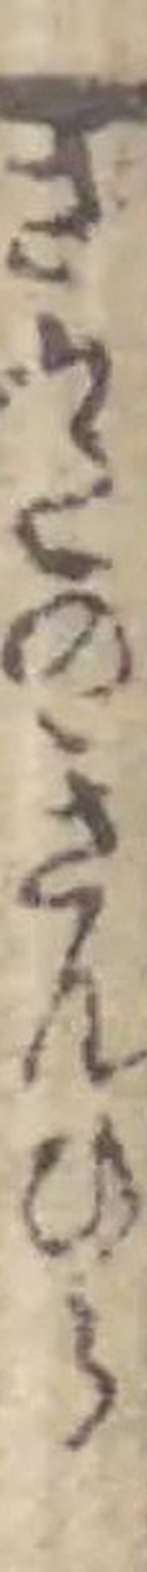さかたのきんひら
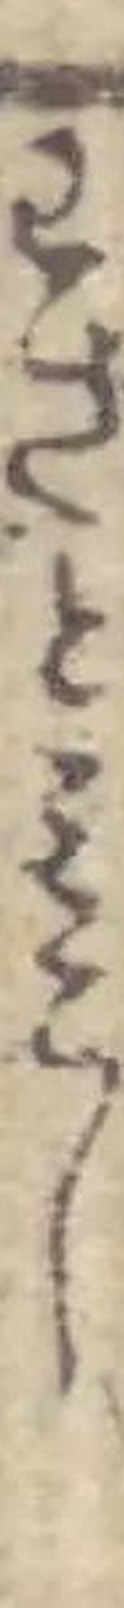わざとみこし
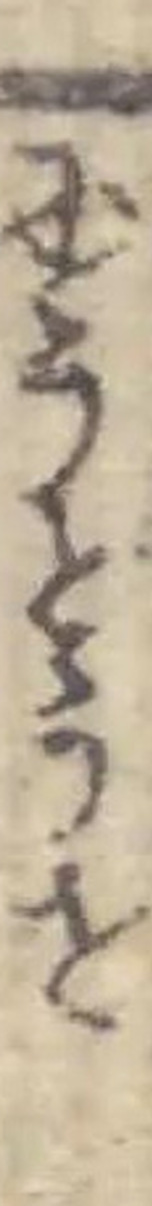にうどうを
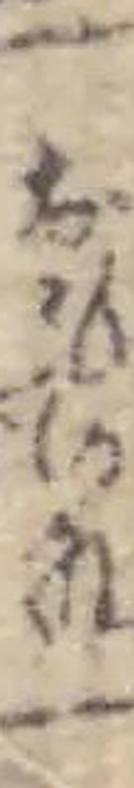おもいれ

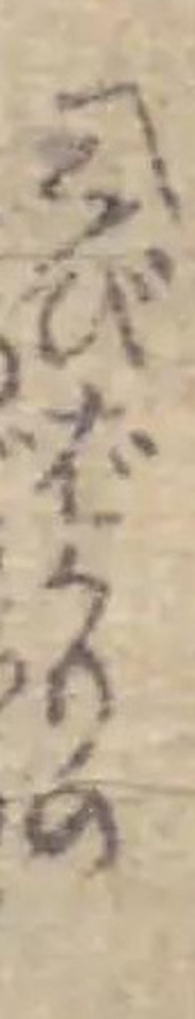〽くびばかりの
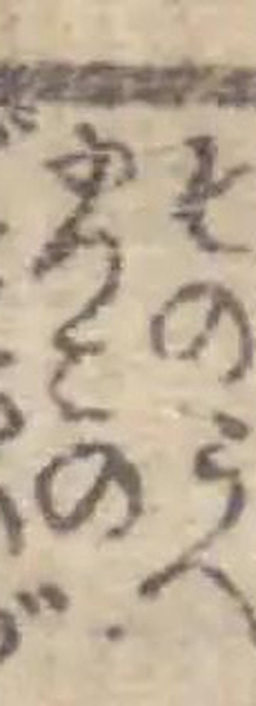やつこの
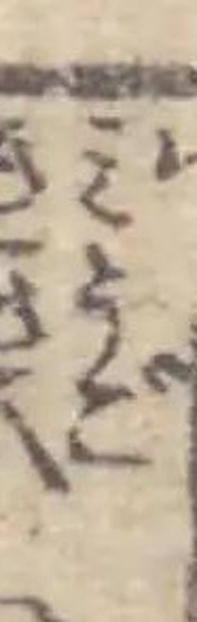みうご
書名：化物尽 4巻
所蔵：国立国会図書館 National Diet Library, JAPAN
